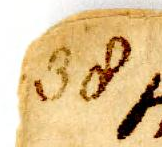38
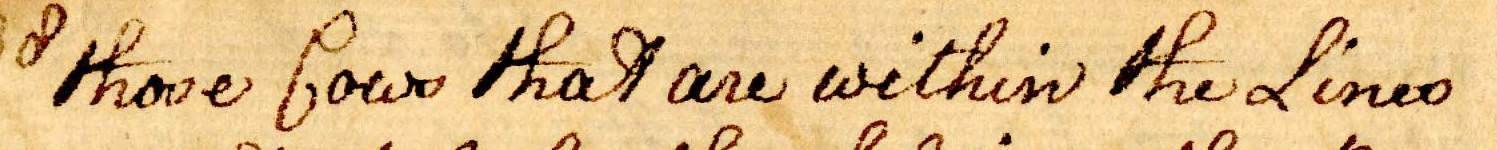those Cows that are within the Lines
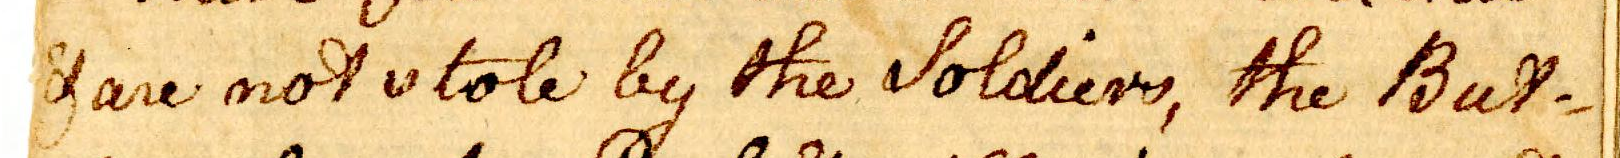& are not stole by the Soldiers, the But-
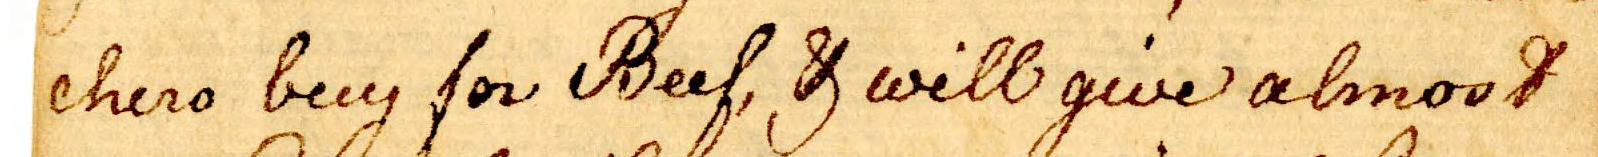chers buy for Beef, & will give almost
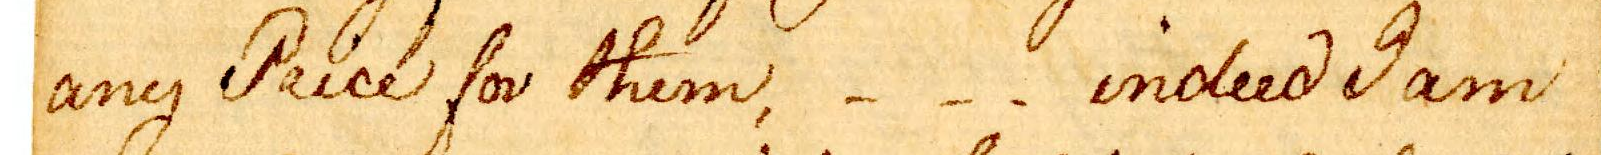any Price for them,-- indeed I am
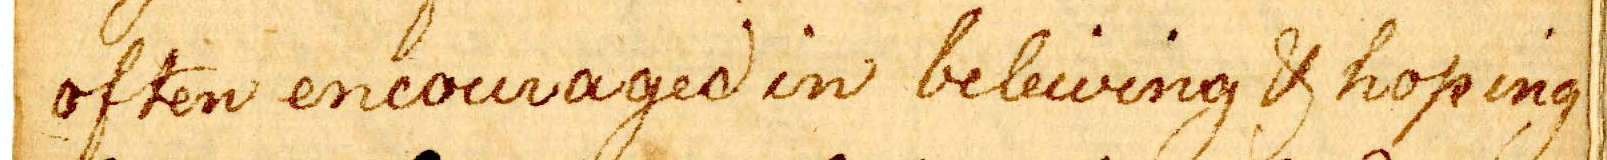often encouraged in beleiving & hoping
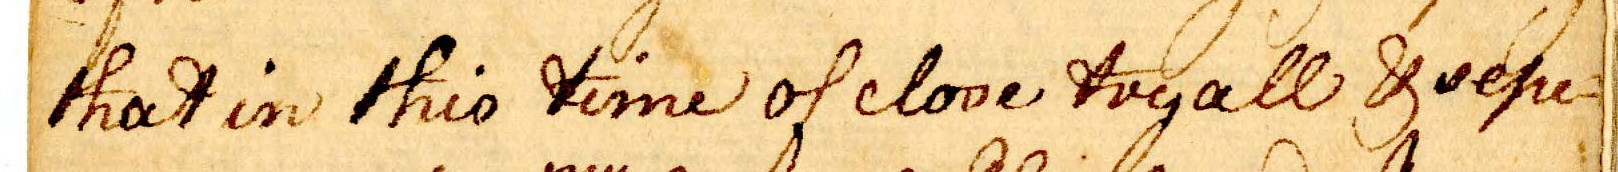that in this time of close tryall & sepe-
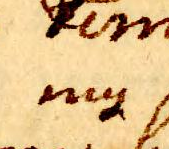my
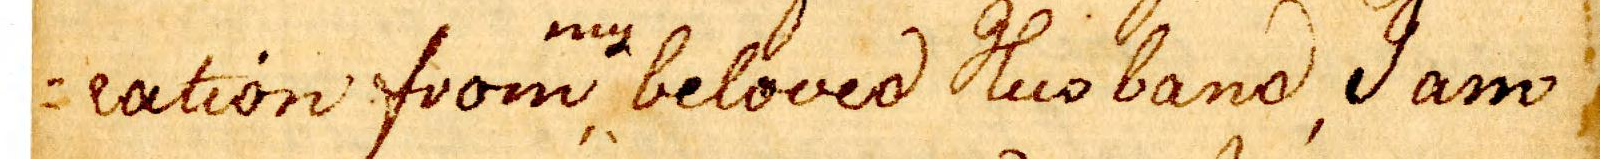-ration from ^ beloved Husband, I am
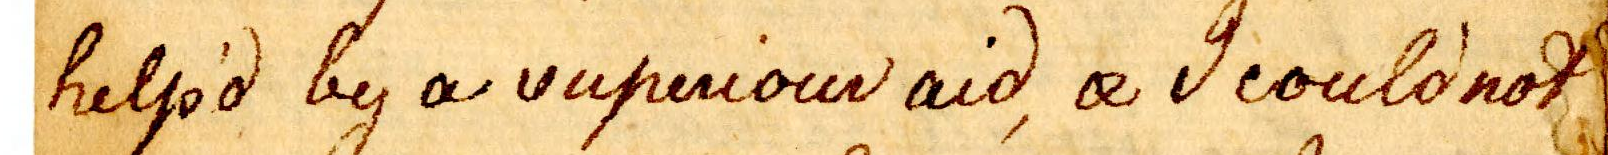help'd by a superiour aid, & I could not
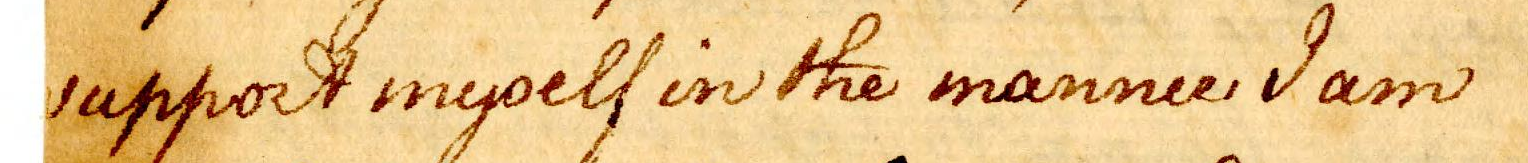support myself in the manner I am
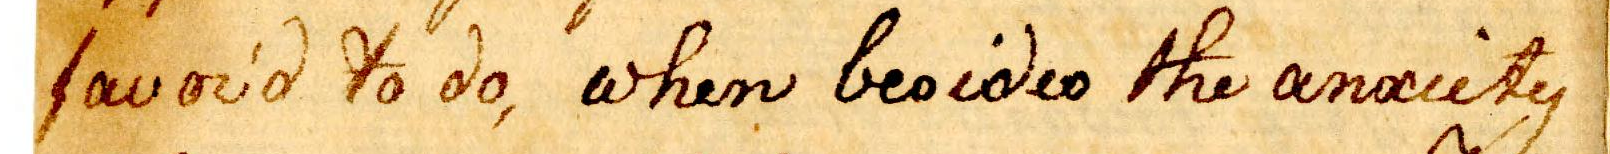favor'd to do, when besides the anxiety
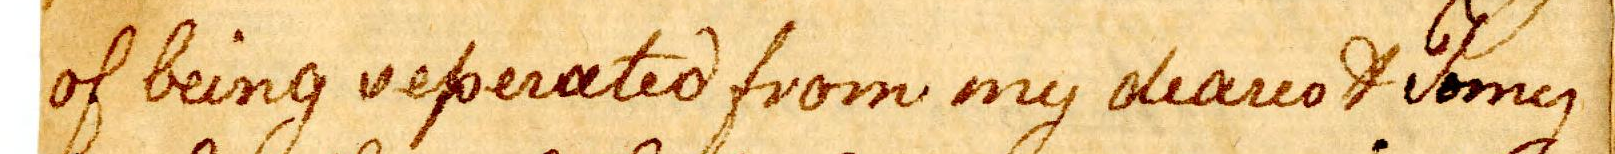of being seperated from my dearest Tomy
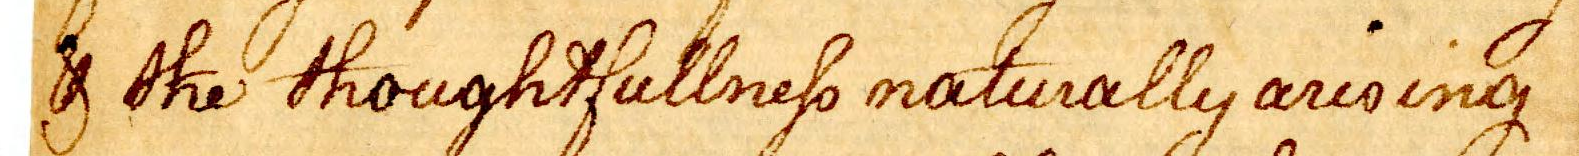& the thoughtfullness naturally arising
